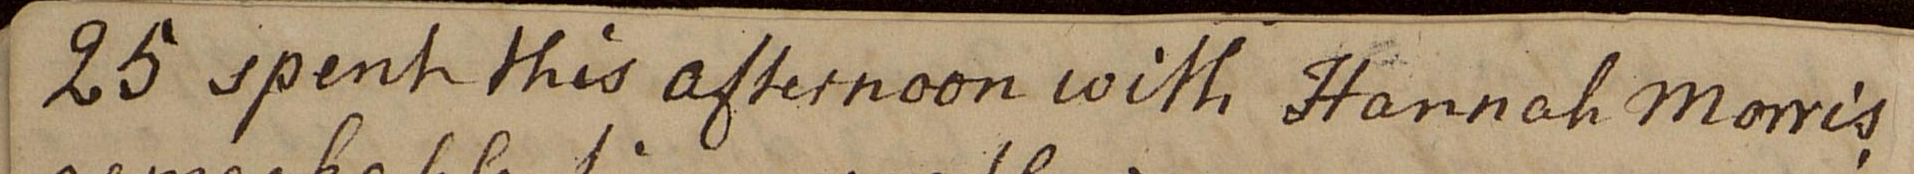25 spent this afternoon with Hannah Morris,
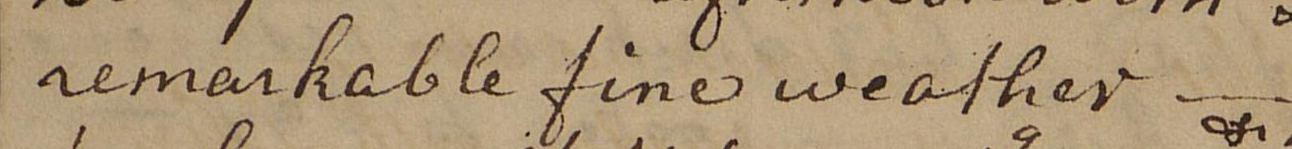remarkable fine weather-
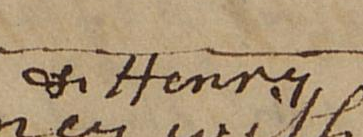& Henry
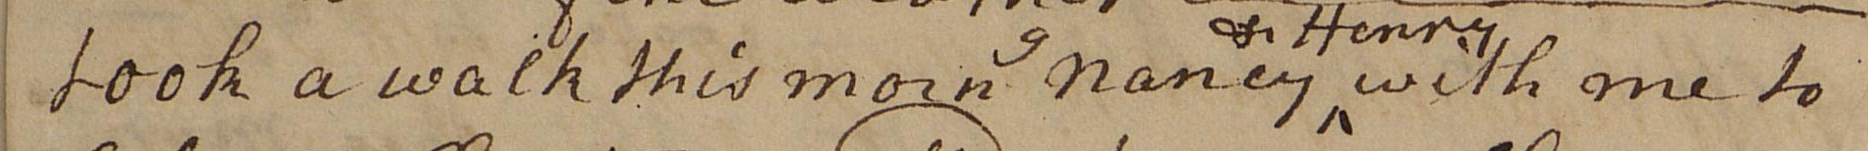took a walk this morn^g Nancy ^ with me to
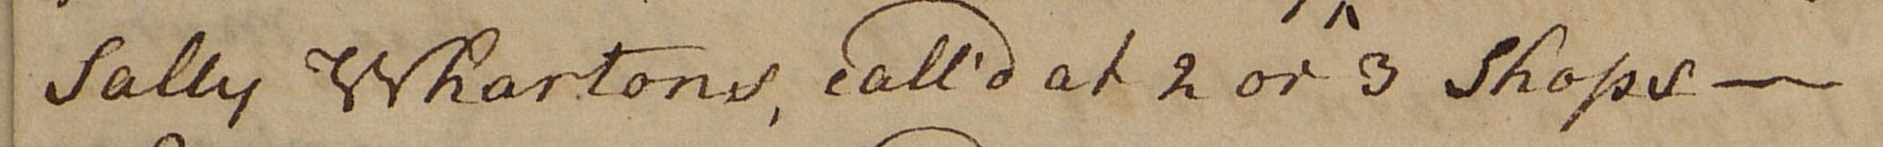Sally Whartons, call'd at 2 or 3 shops-
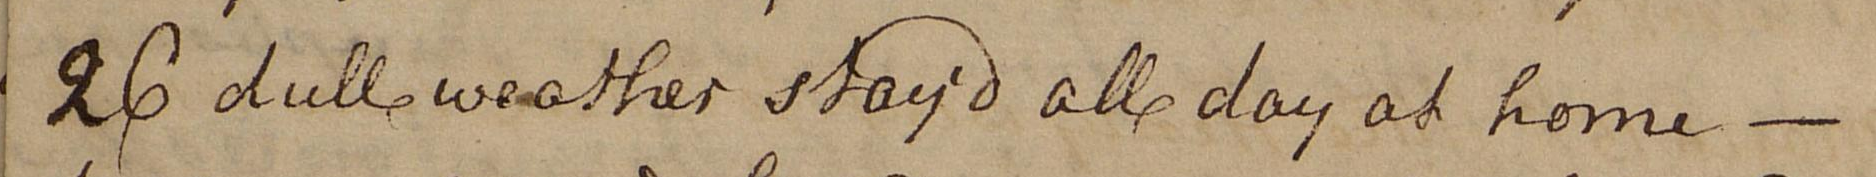26 dull weather stay'd all day at home-
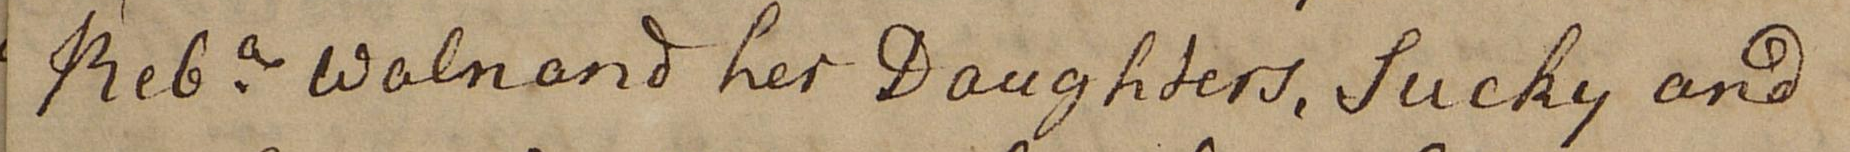Reb^a. Waln and her Daughters, Sucky and
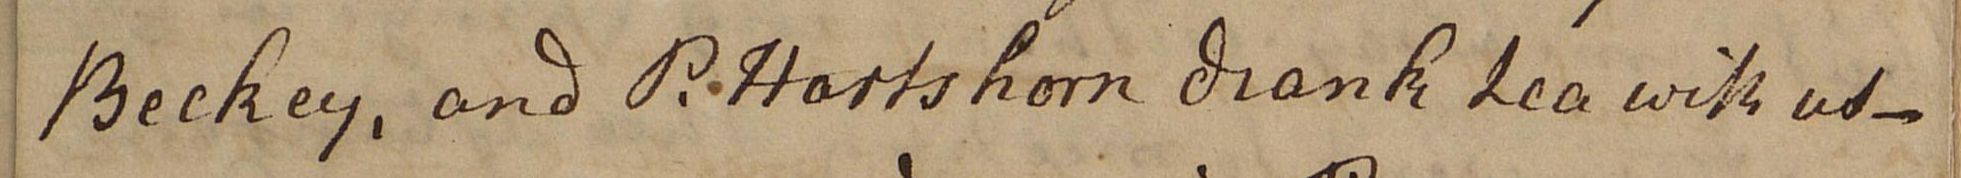Beckey, and P. Hartshorn drank tea with us-
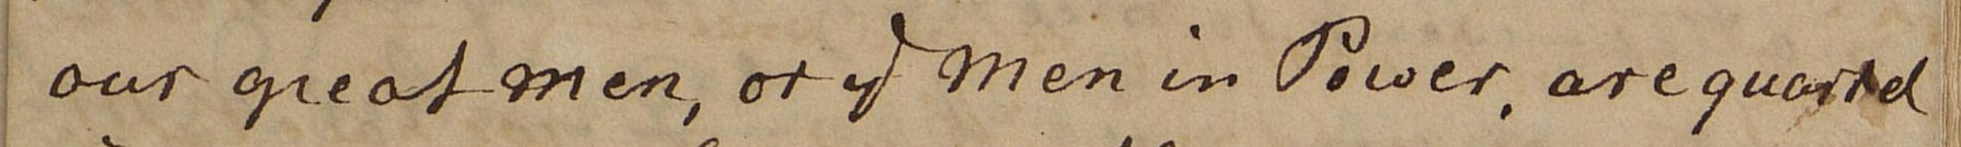our great men, or y^e men in Power, are quarrel
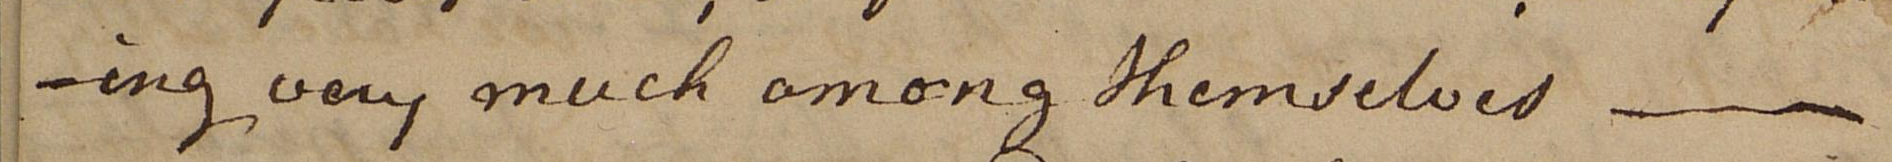-ing very much among themselves-
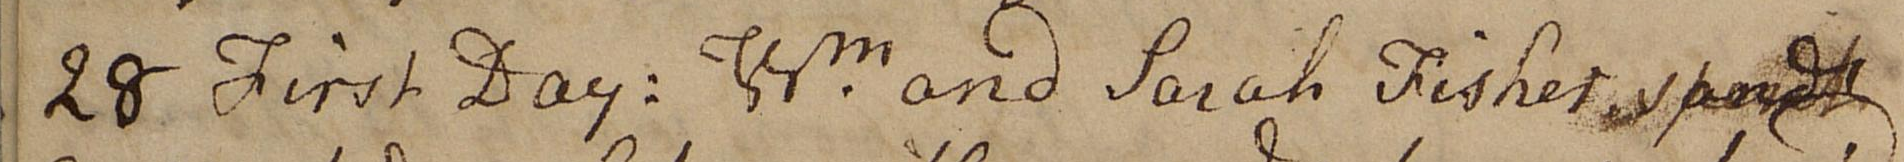28 First Day: W^m. and Sarah Fisher and
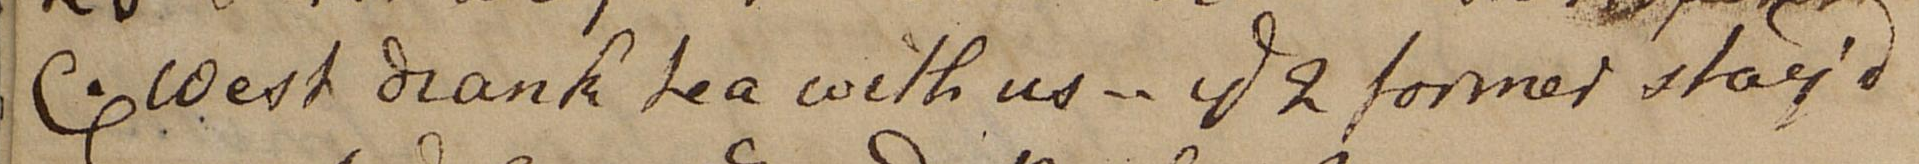C. West drank tea with us- y^e 2 former stay'd
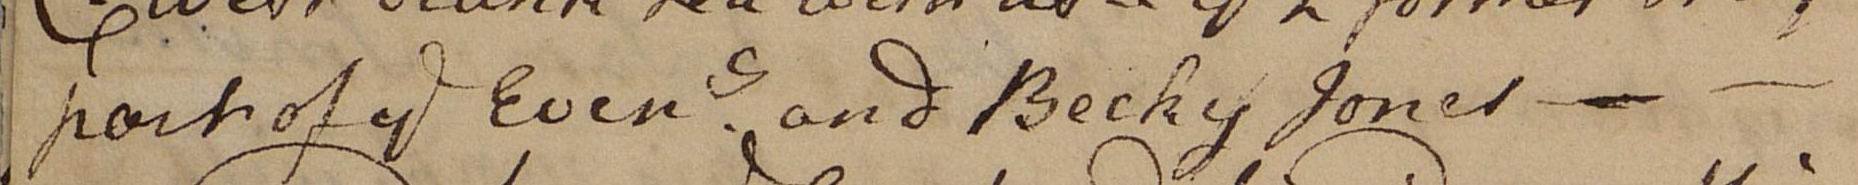part of y^e Even^g. and Becky Jones-
